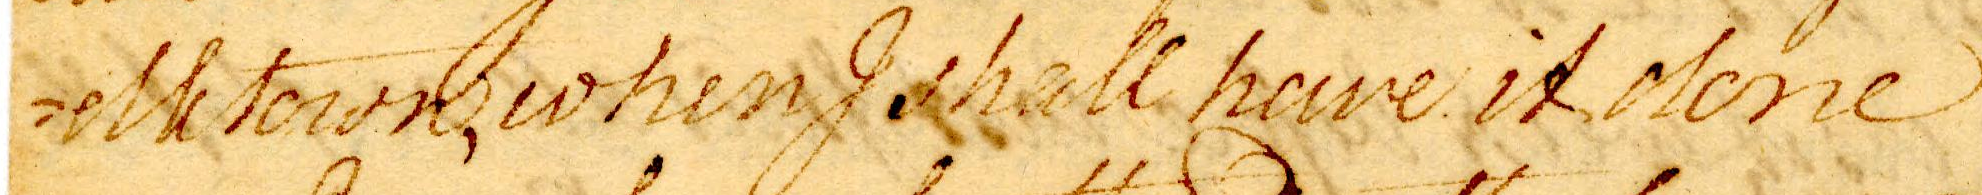-dletown, when I shall have it done
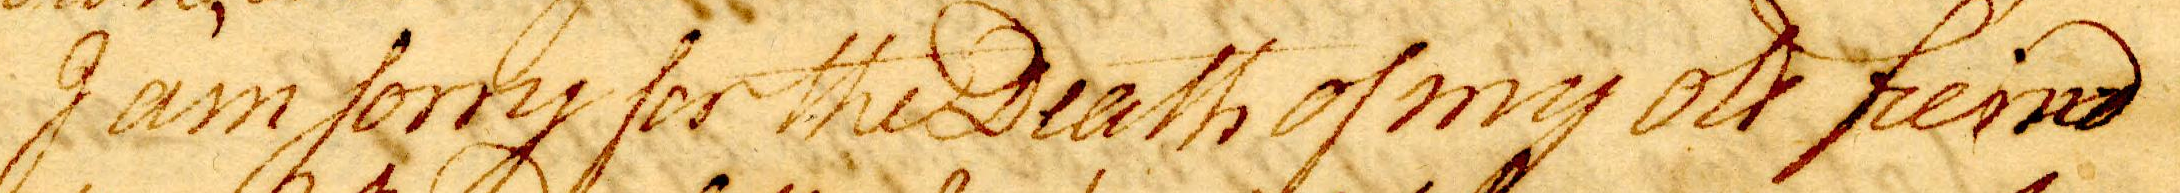I am sorry for the Death of my old friend
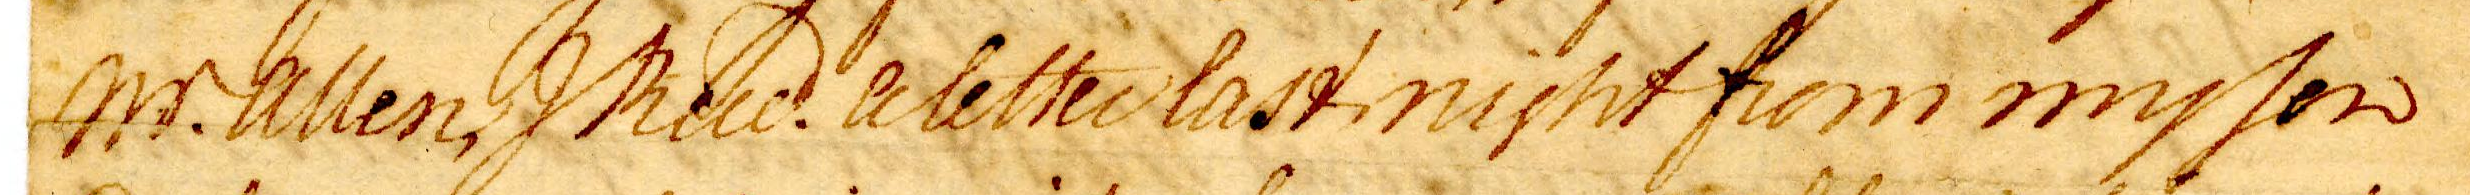M^r Allen, I Rec^d. a letter last night from my son
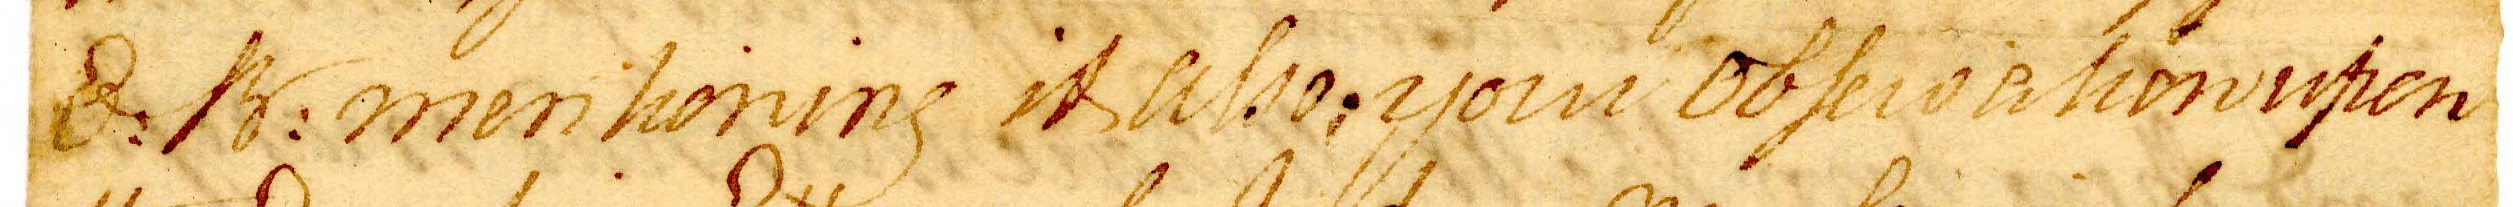E: B: mentioning it also, your Observations upon
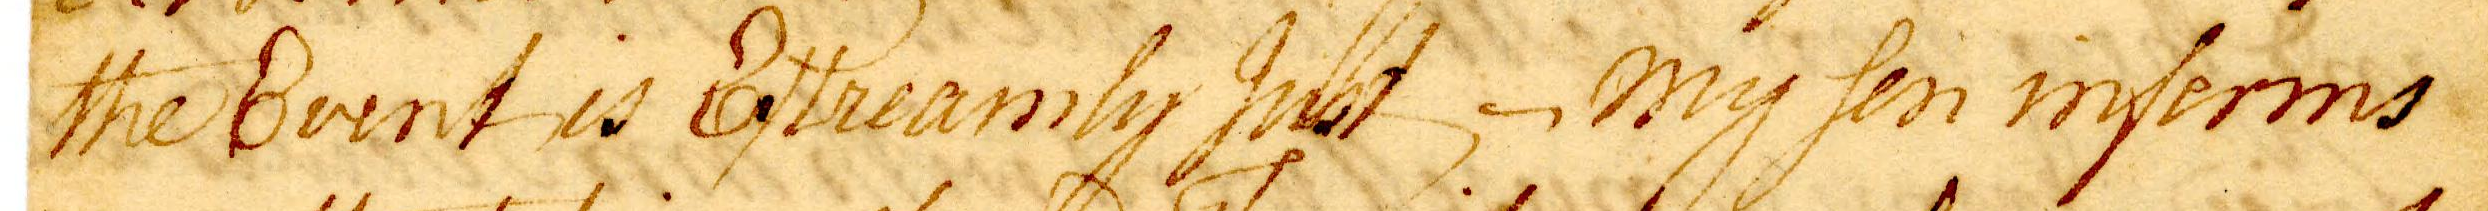the Event is Extreamty Just. My Son informs
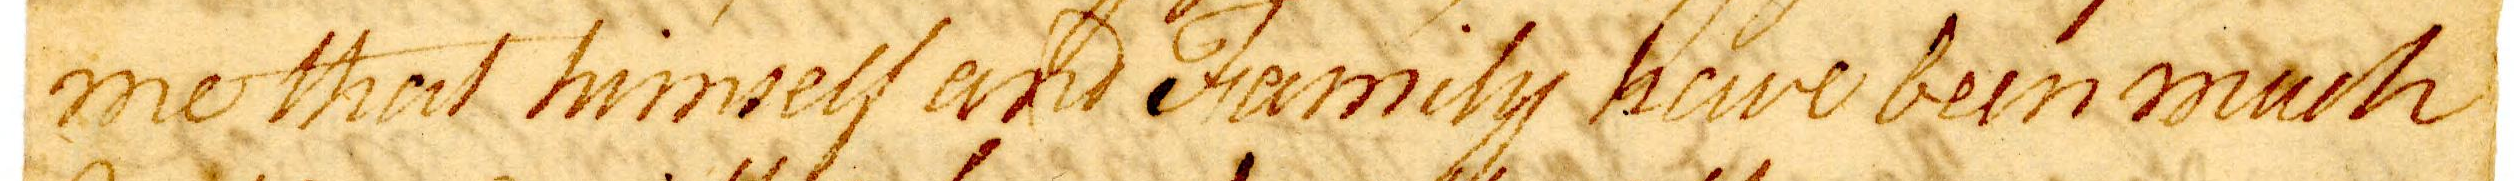me that himself and Family have been much
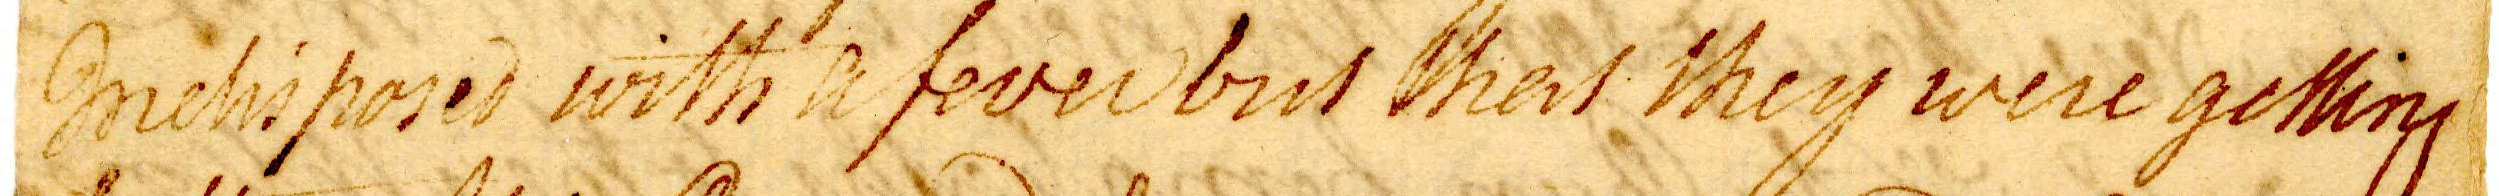Indisposed with a fever but that they were getting
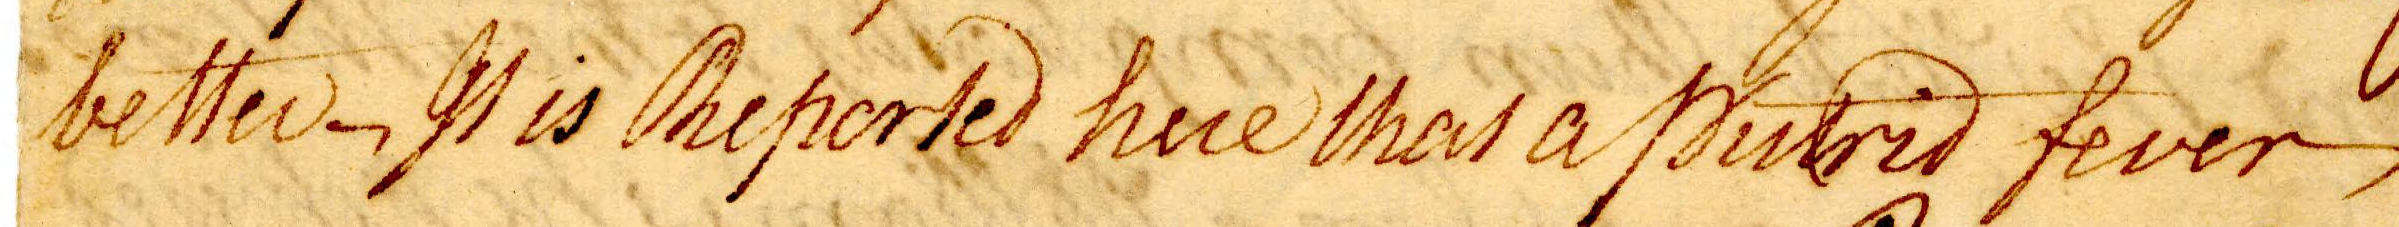better. It is Reported here that a Putrid fever
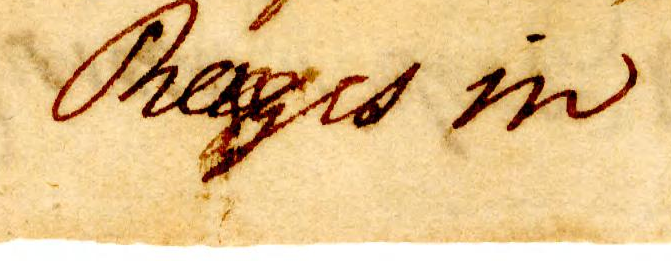Rages in
